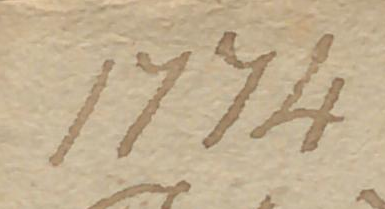1774
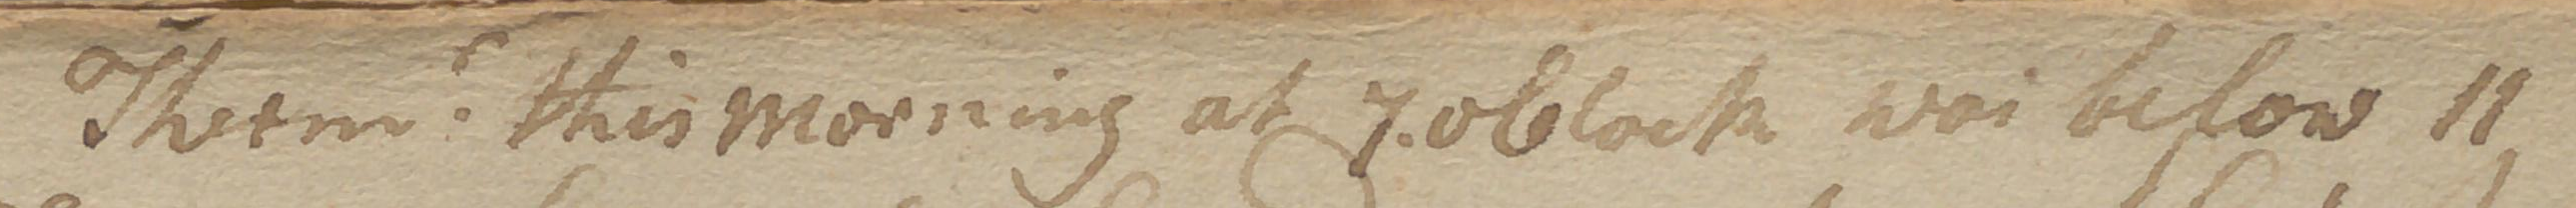Therm^r. this morning at 7 oClock was below 11
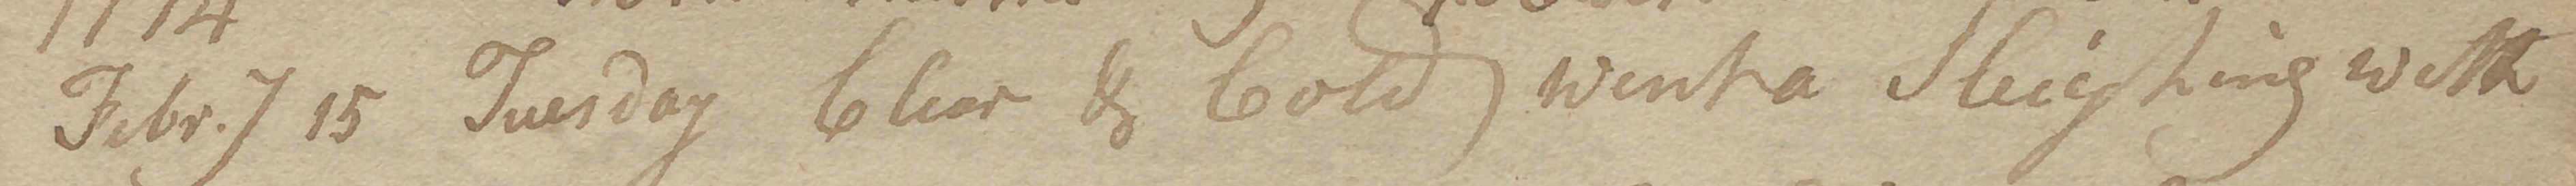Febr^y. 15 Tuesday Clear & Cold went a Sleighing with
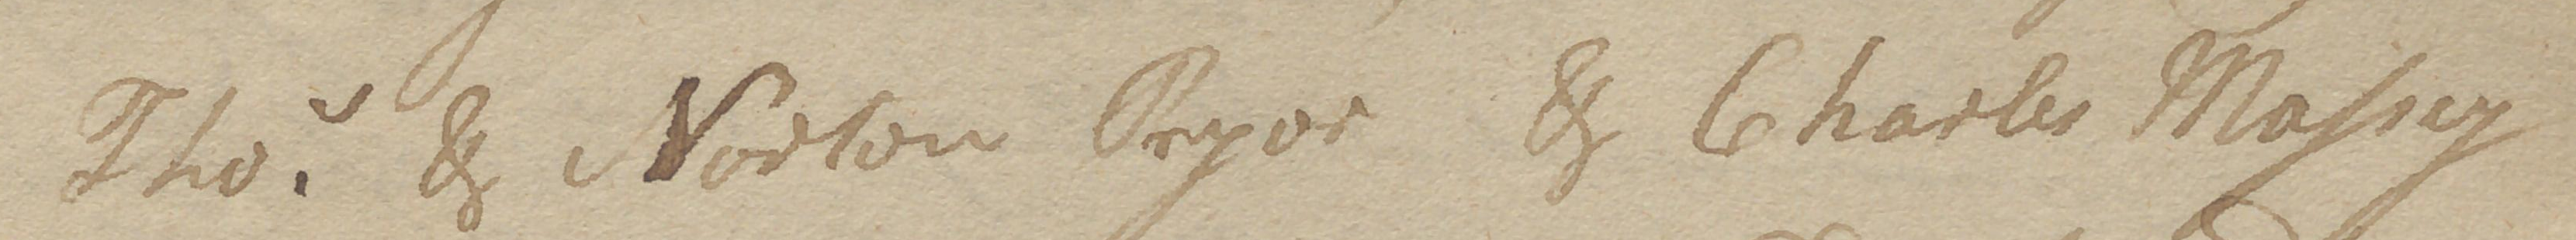Tho^s. & Norton Pryor & Charles Massey
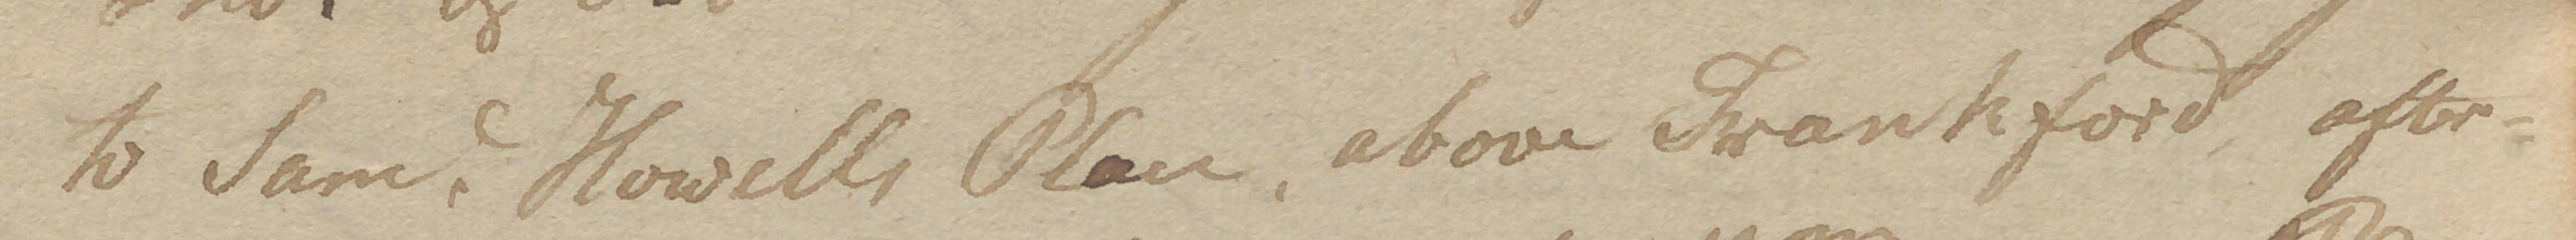to Sam^l. Howells Plan, above Frankford, after-
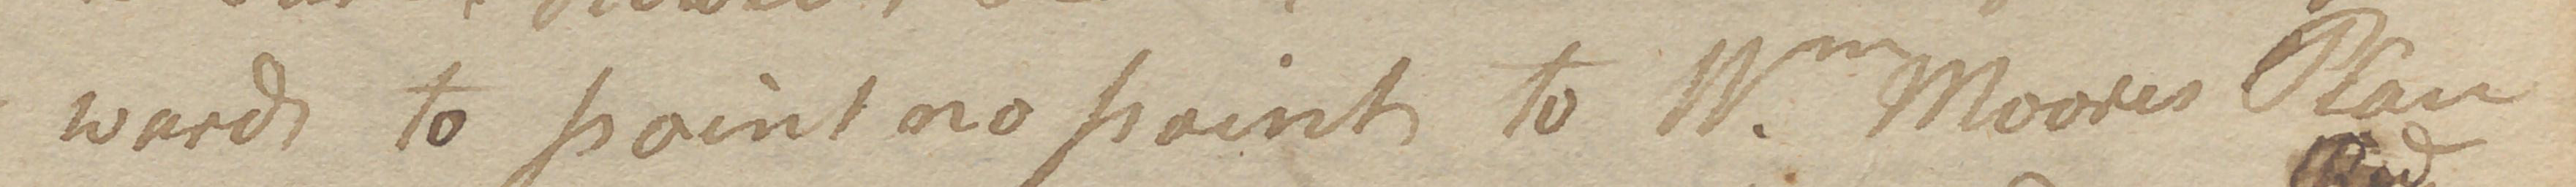wards to point no point to W^m. Moores Plan
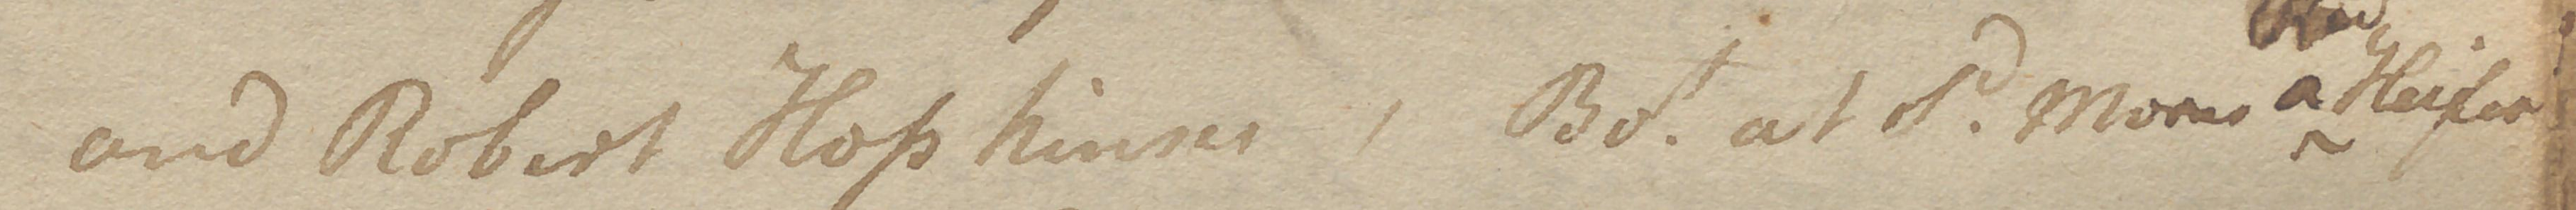and Robert Hopkinses, Bo^t. at s^d. Mores a ^ Heifer
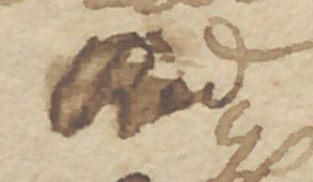Red
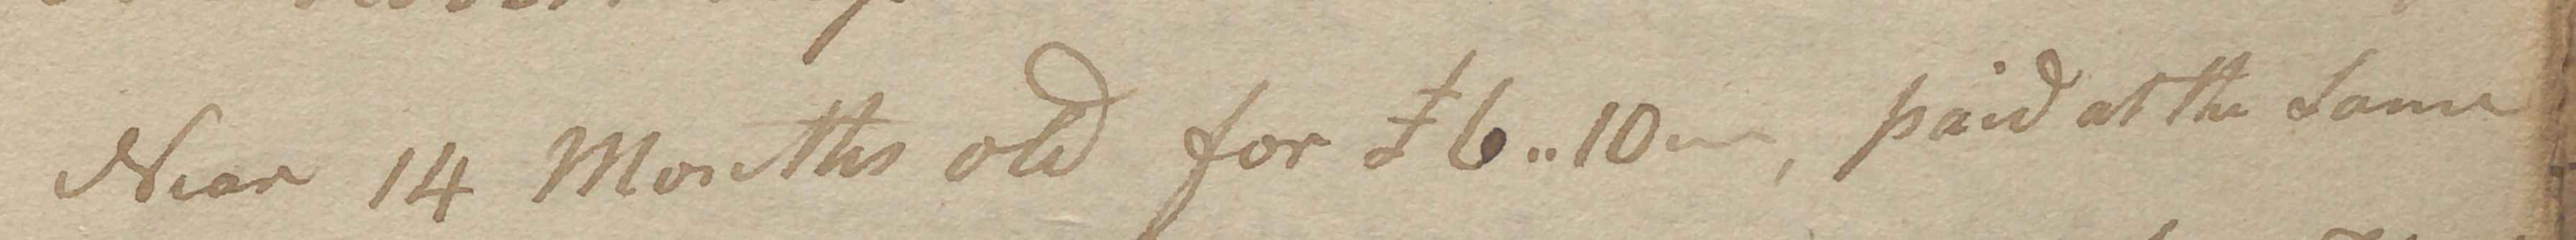Near 14 Months old for £6..10-, paid at the Same
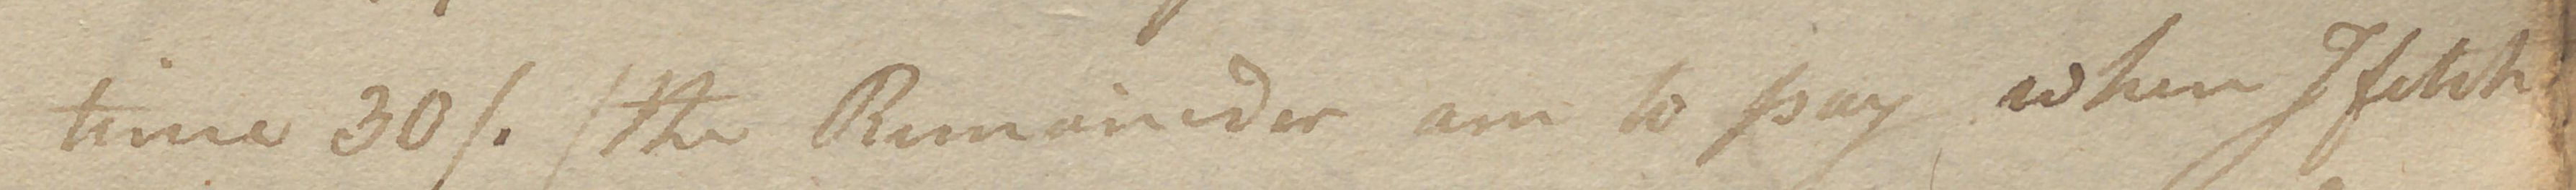time 30s. the Remainder am to pay when I fetch^d.
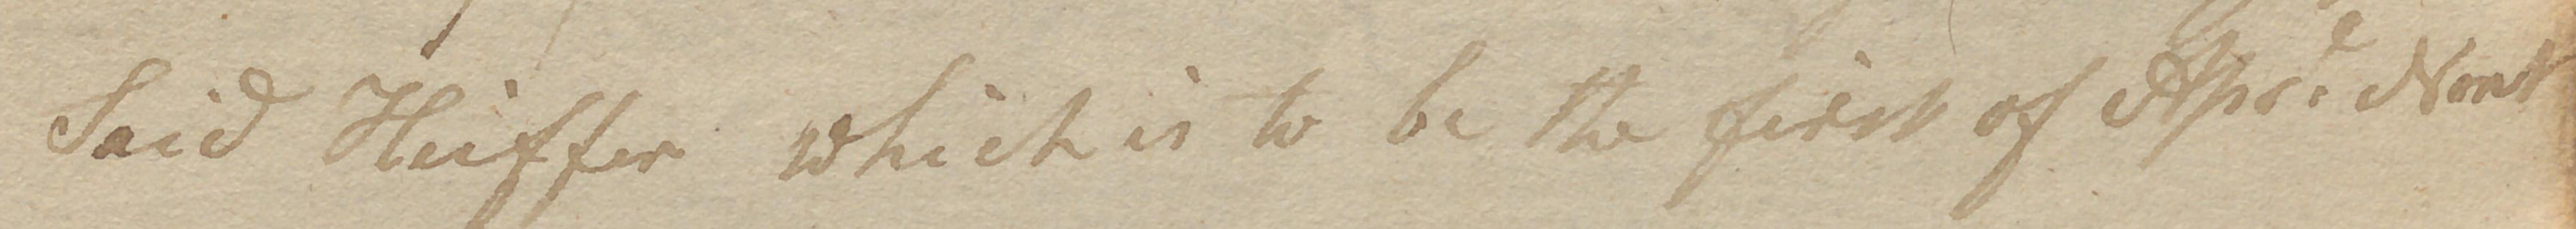Said Heiffer, which is to be the first of Apr^l. Next
